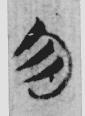勿（物）
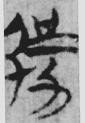○（強）
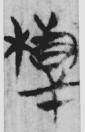○（檊）
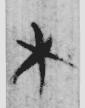木
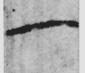一
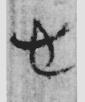心
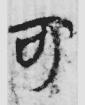可
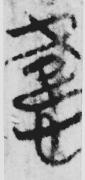愇（違）
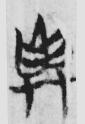與（於）
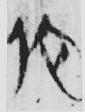佗（它）
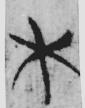木
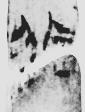非
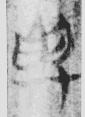與
